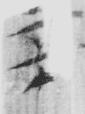不
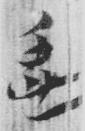○（仁）
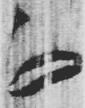㠯（以）
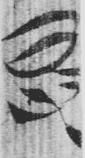𠭁
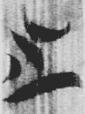之
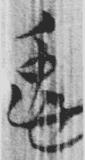○（仁）
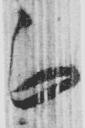㠯（以）
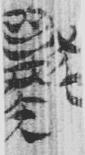獸（守）
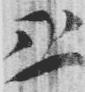之
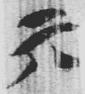亓（其）
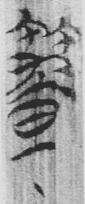○（運）
